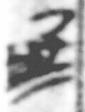爲
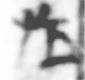○（左）
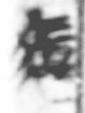驂
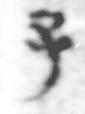子（牸）
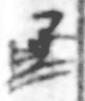爲
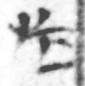○（左）
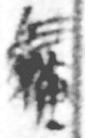○（服）
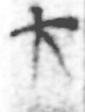大
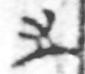之
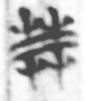𣗥（束）
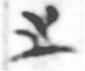之
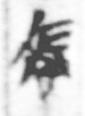駟
